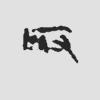取
